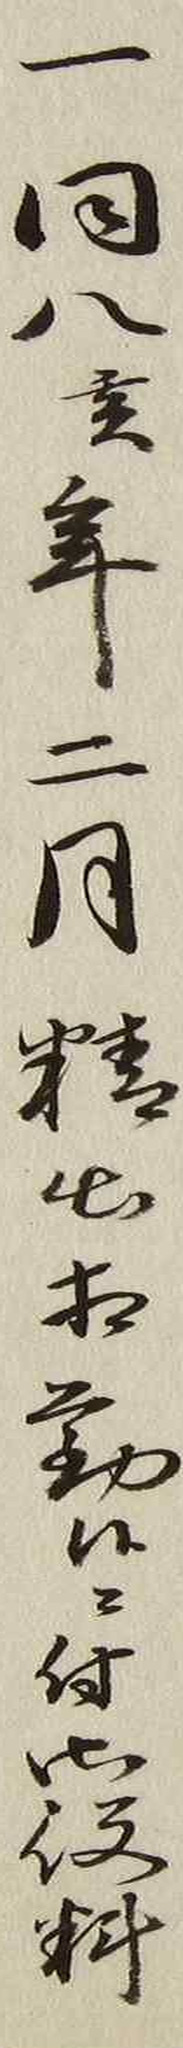一同八亥年二月精出相勤候ニ付御役料
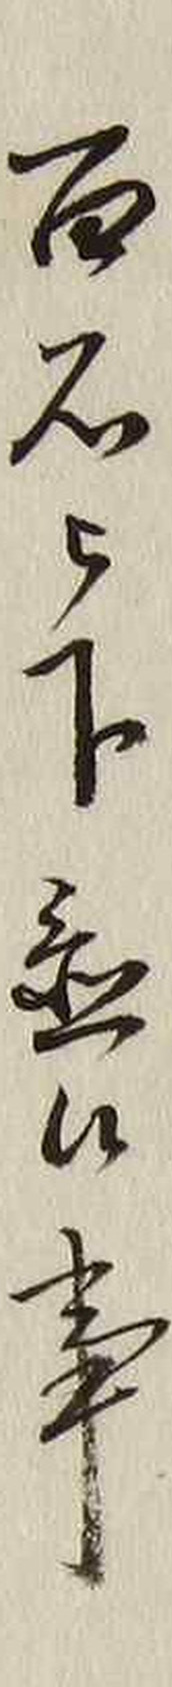百石被下置候事
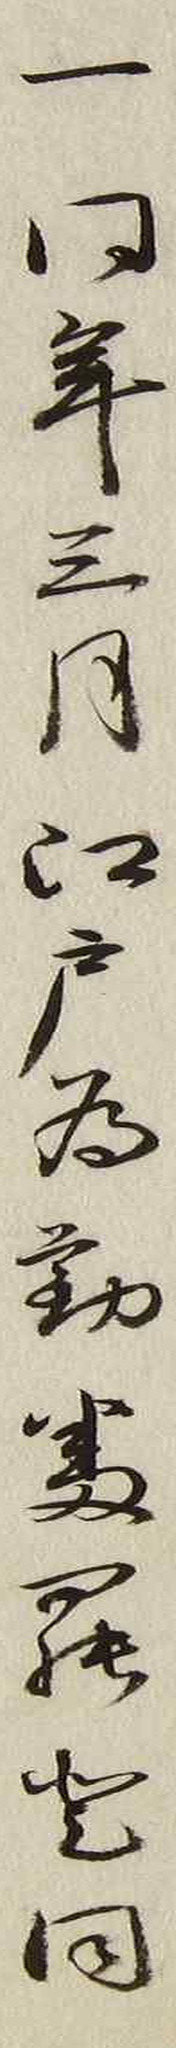一同年三月江戸為勤番罷登同
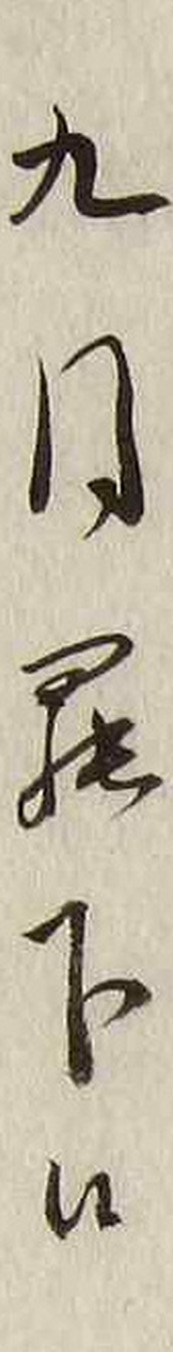九月罷下候
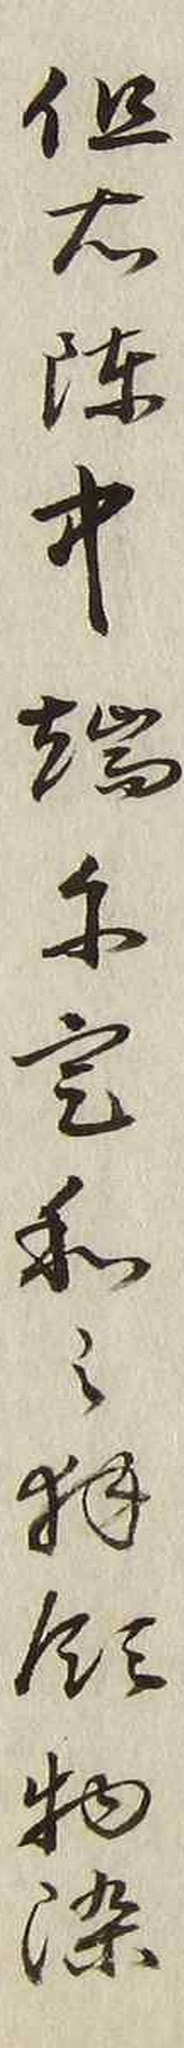但右陣中端午定和之拝領物染
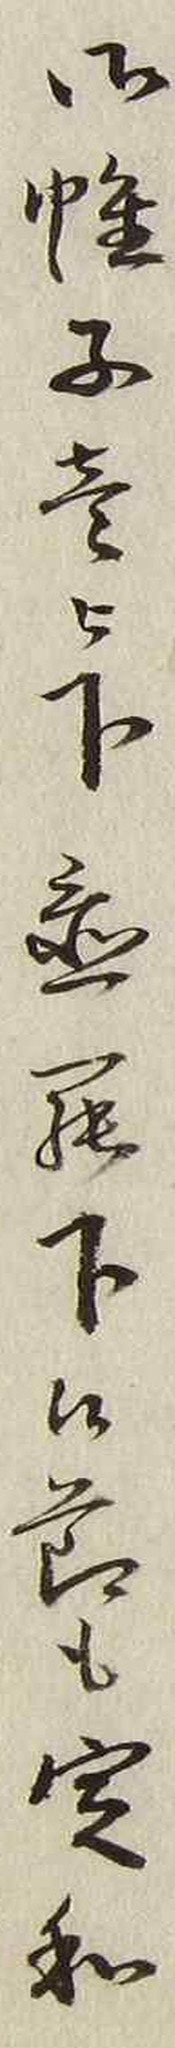御帷子壱被下置罷下候節も定和

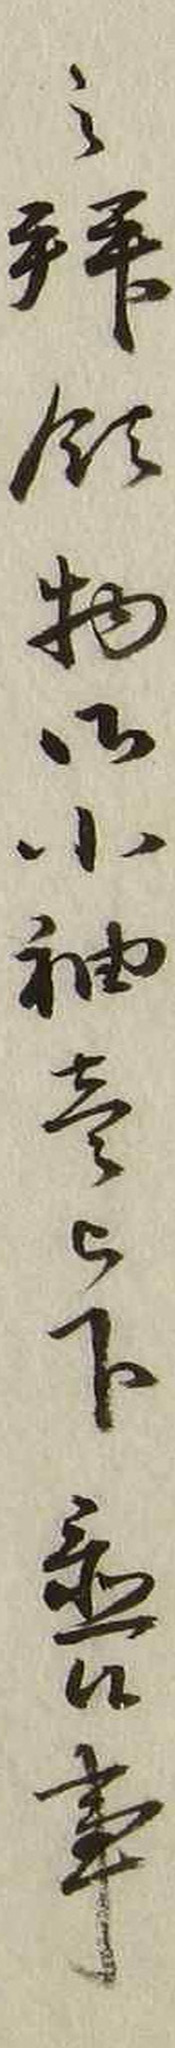之拝領物御小袖壱被下置候事
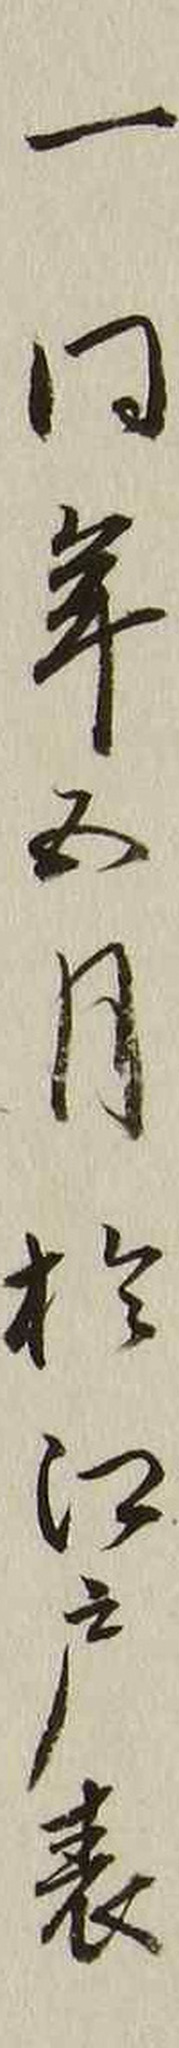一同年五月於江戸表
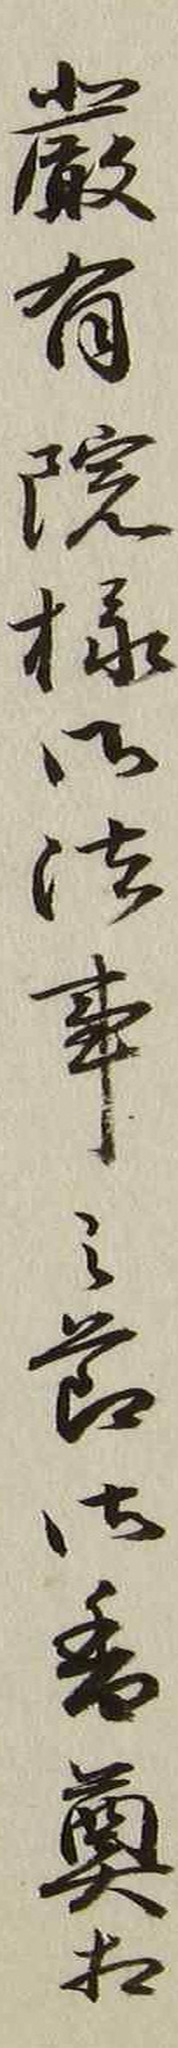厳有院様御法事之節御香奠相
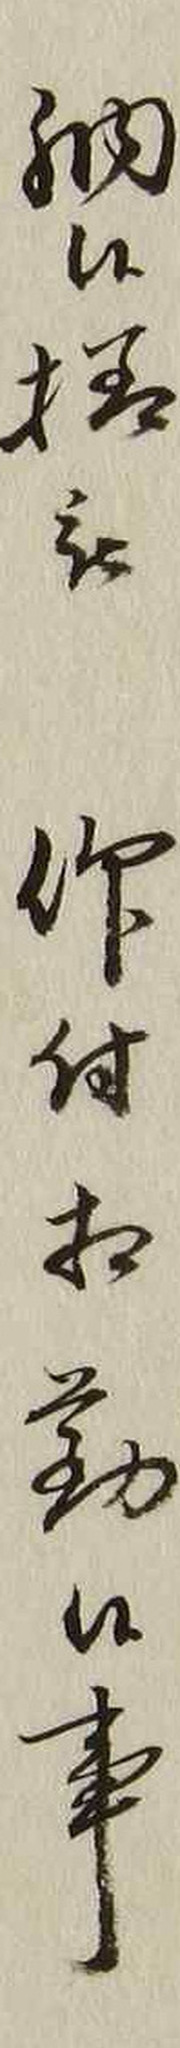納候様被仰付相勤候事
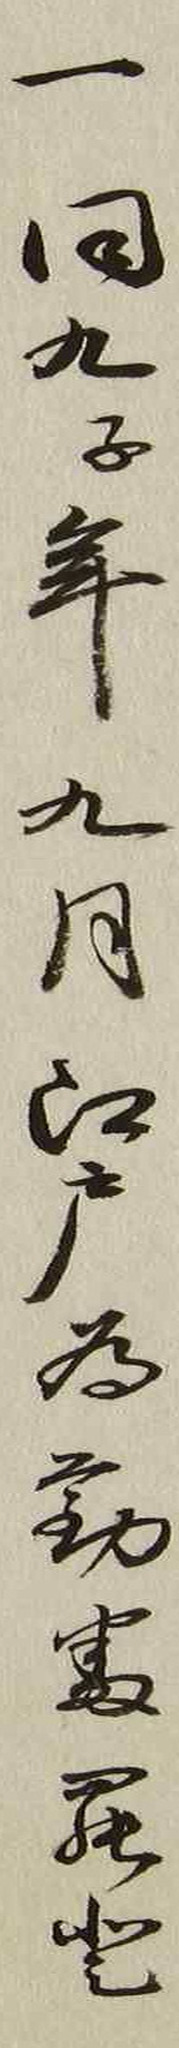一同九子年九月江戸為勤番罷登
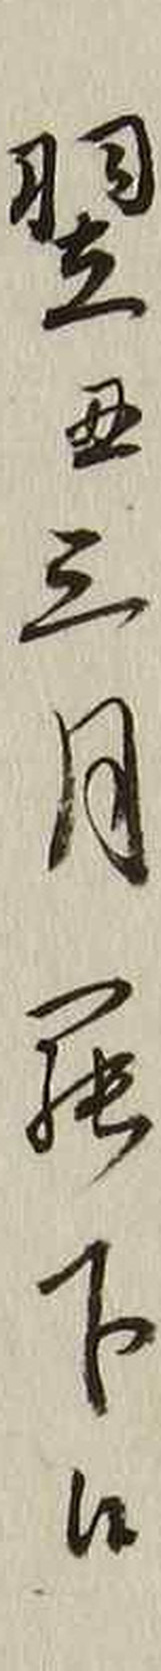翌丑三月罷下置候
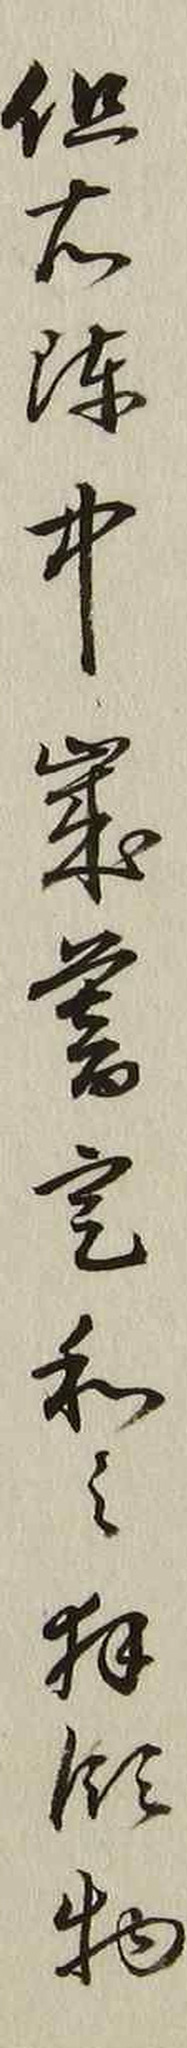但右陣中歳暮定和之拝領物
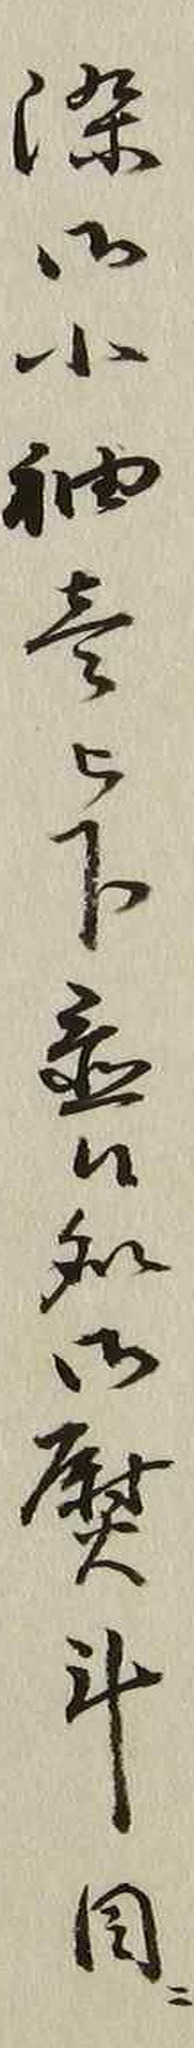染御小袖壱被下置候処御熨斗目ニ
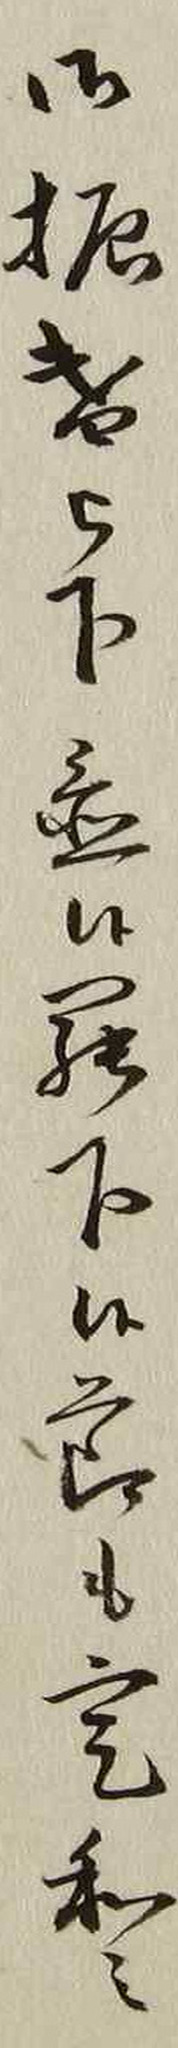御振替被下置候罷下候節も定和之
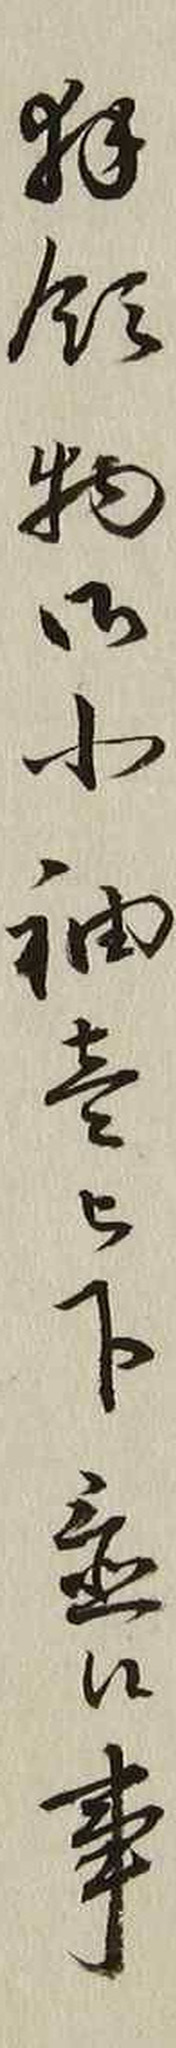拝領物御小袖壱被下置候事
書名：諸士系譜　巻之160　な之部2
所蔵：会津若松市立会津図書館
